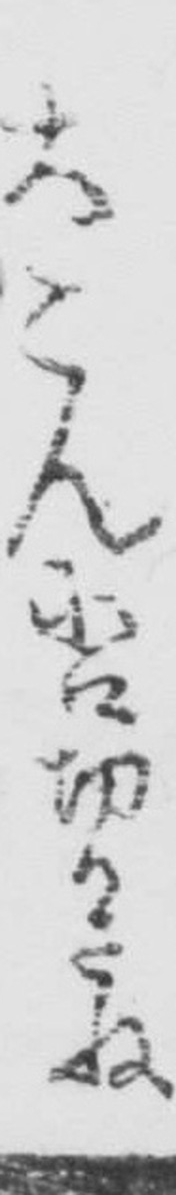大こん小口切かさね
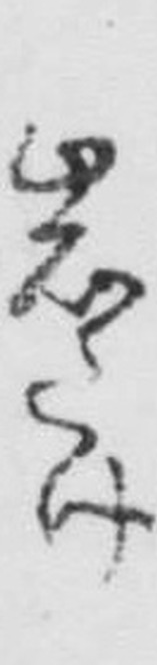岩たけ
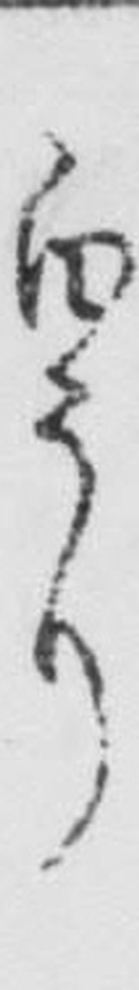白うり
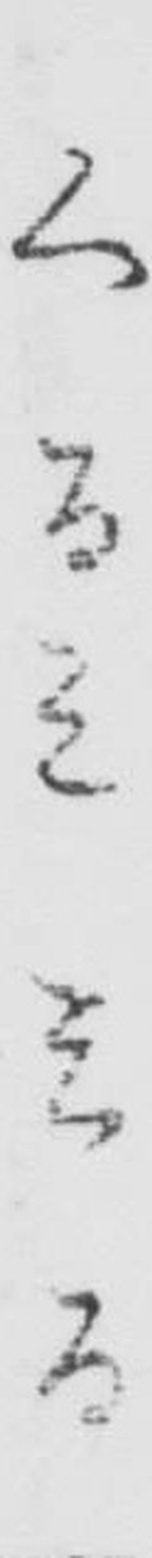くるみみる
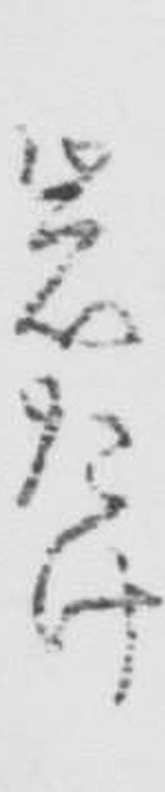岩たけ
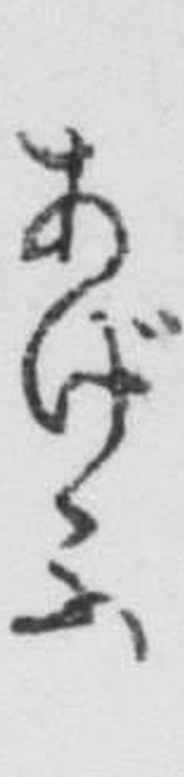あげふ
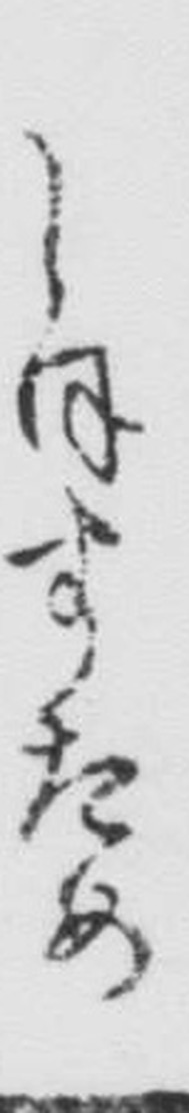しほすため
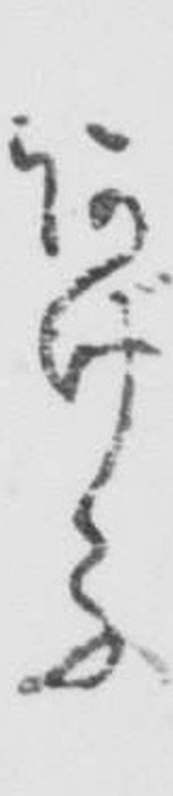あげふ
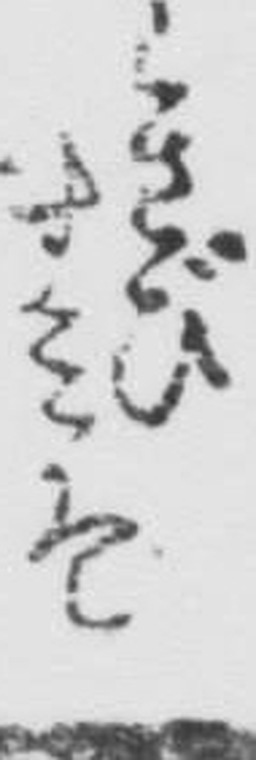すみそ

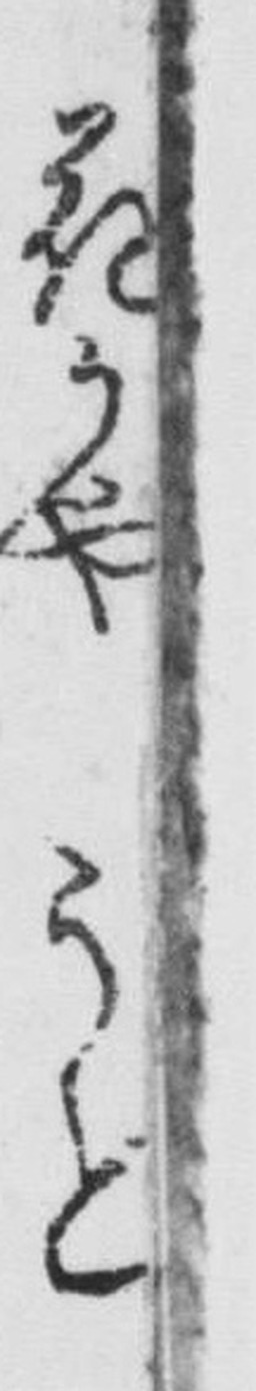花かやうど
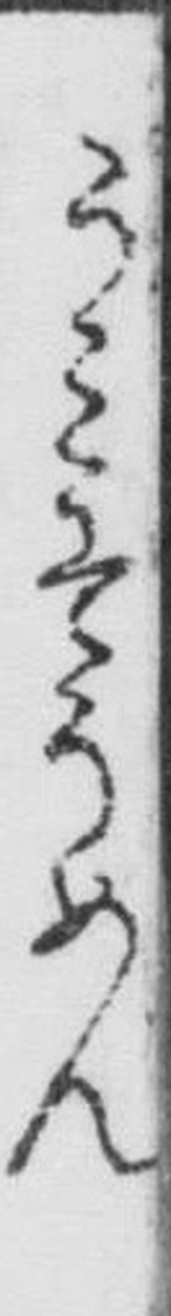うとそうめん
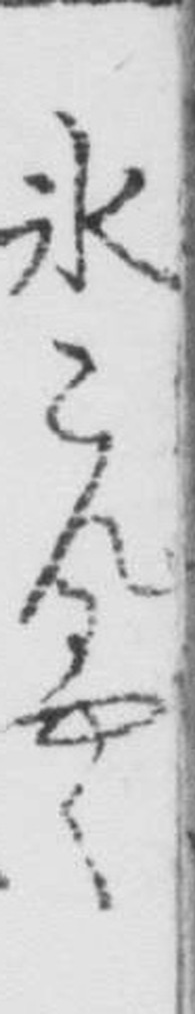氷こんにやく
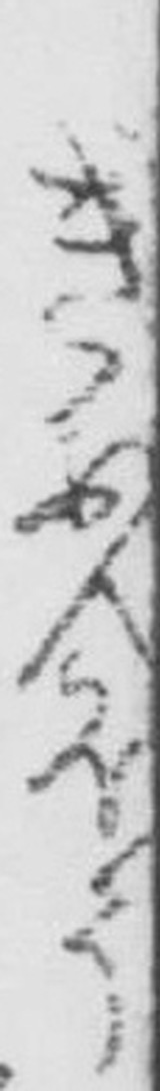きおんほう
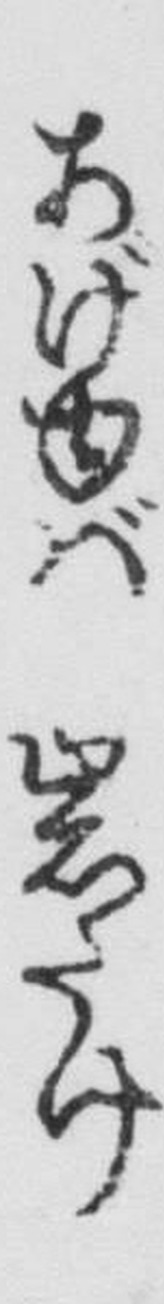あげゆば岩たけ
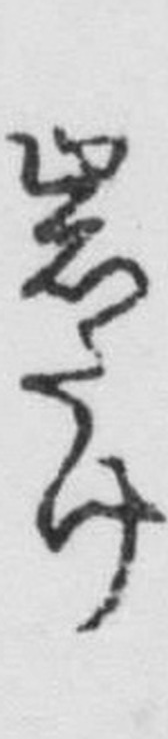岩たけ
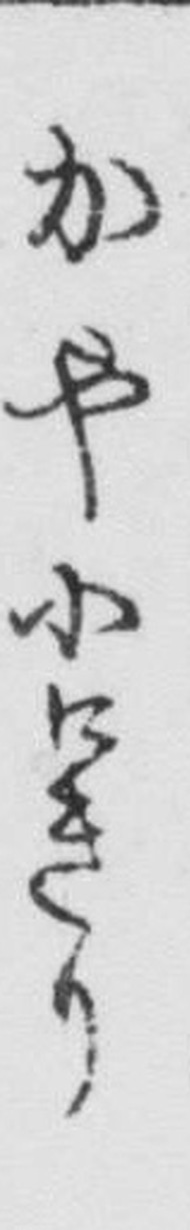かや小にきり
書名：諸家通用/即席料理
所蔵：大阪府立大学学術情報センター 国文学研究資料館
